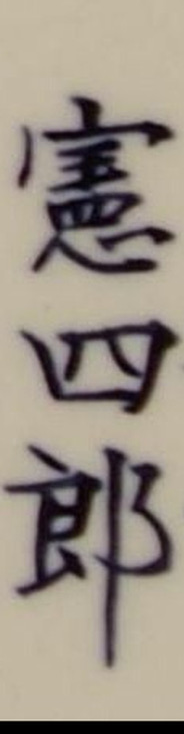憲四郎
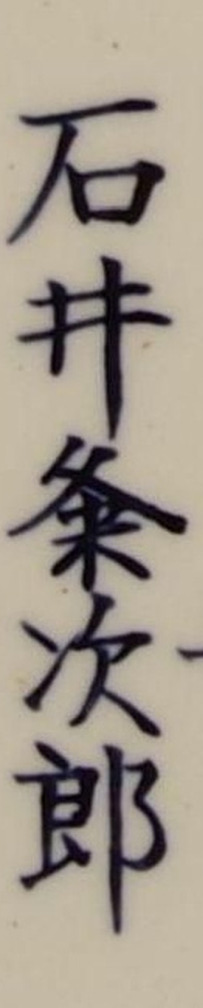石井粂次郎

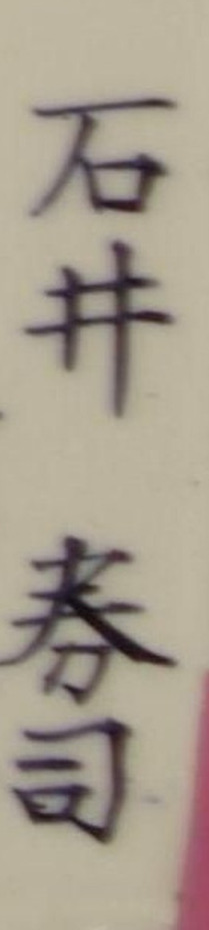石井券司
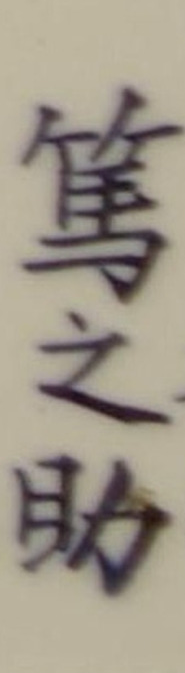篤之助
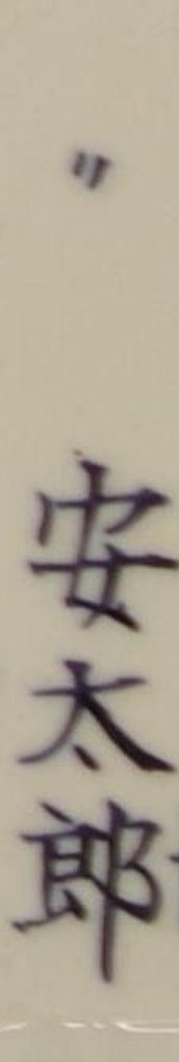安太郎
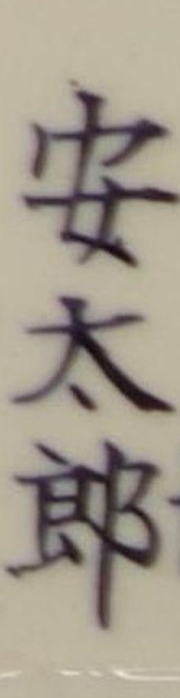安太郎
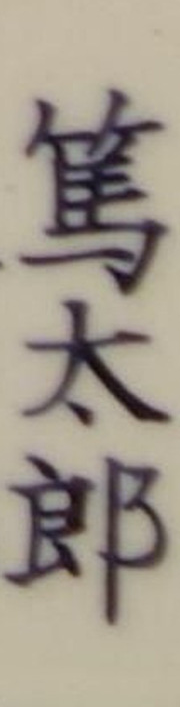篤太郎
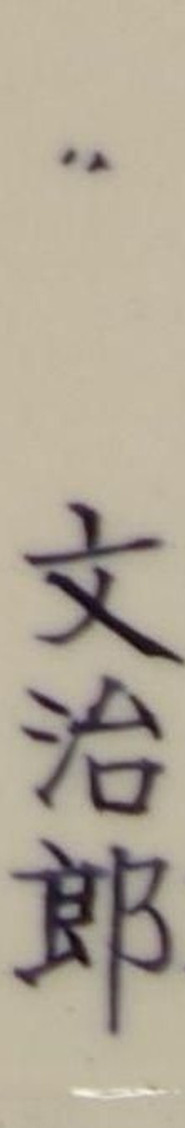文治郎
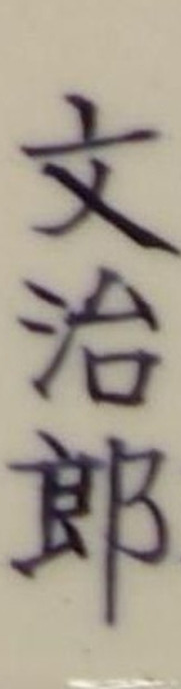文治郎
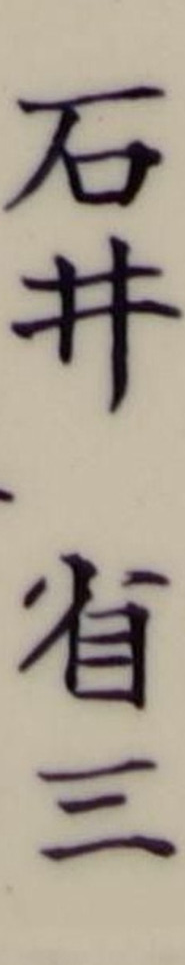石井省三
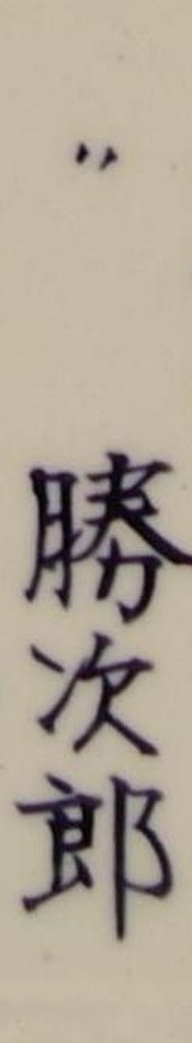勝次郎
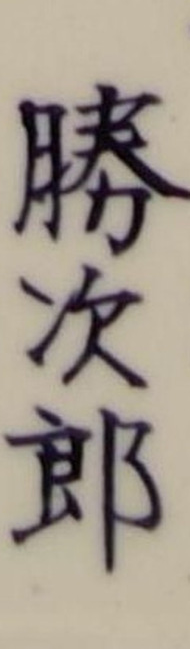勝次郎
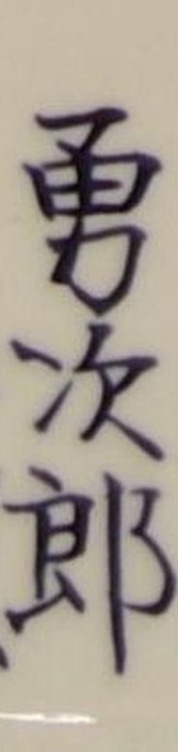勇次郎

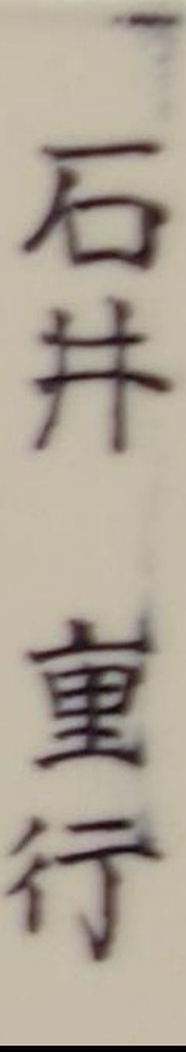石井重行
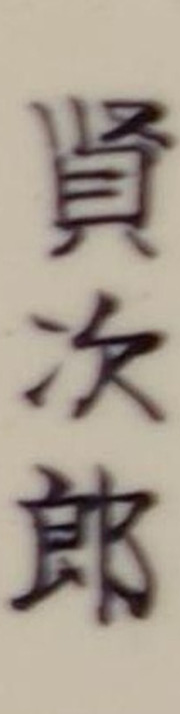賢次郎
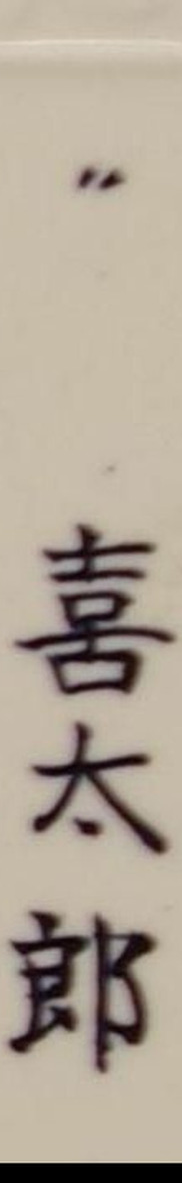喜太郎
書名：M~S
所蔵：高野山金剛峯寺
